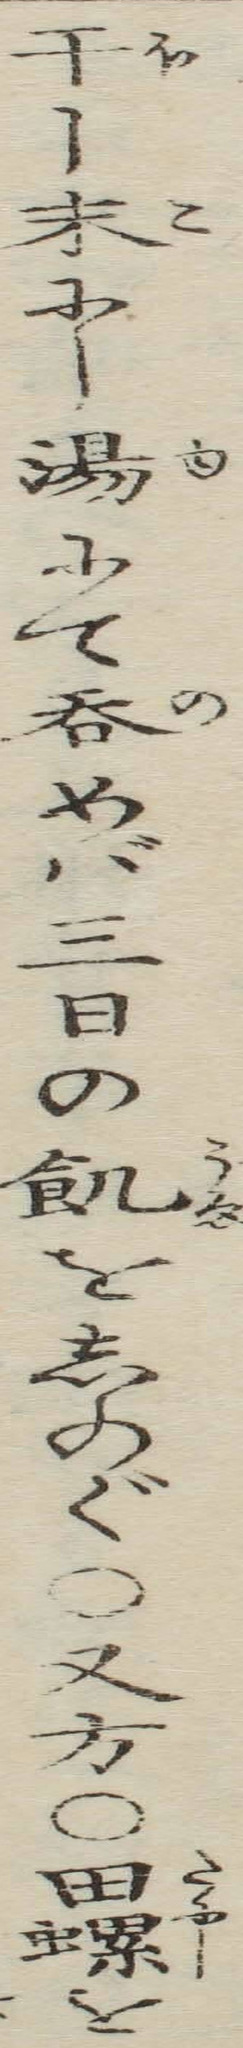干し末にし湯にて呑めば三日の飢をしのぐ○又方○田螺を
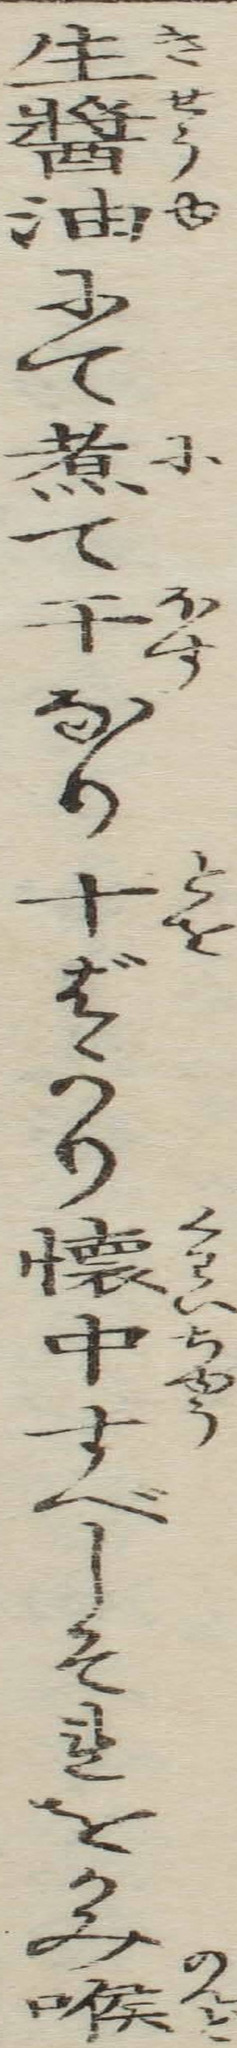生醤油にて煮て干なり十ばかり懐中すべしそれをかみ喉

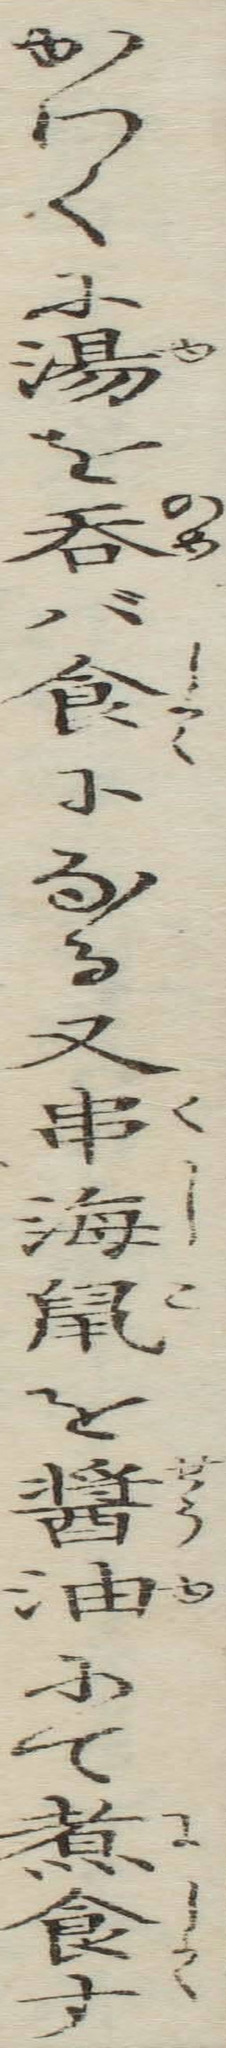かわくに湯を呑ば食になる又串海䑕を醤油にて煮食す
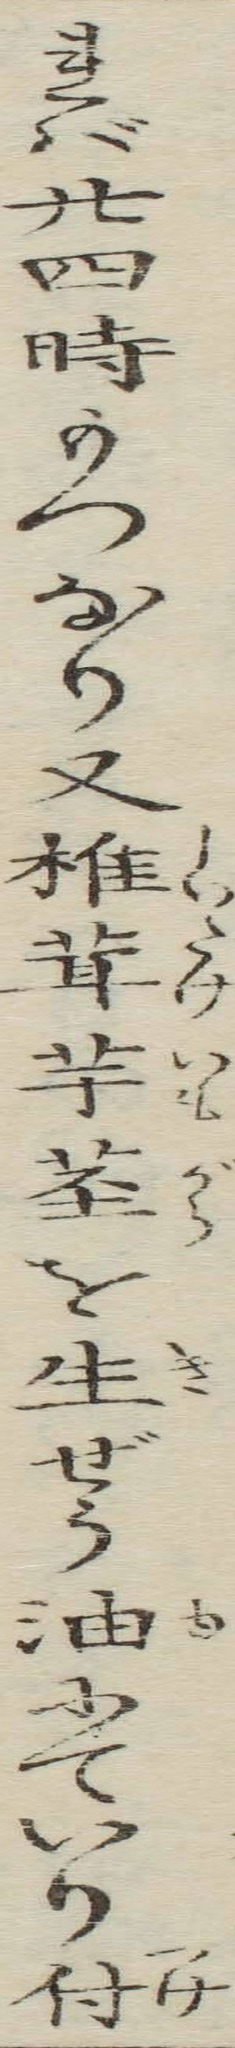れば廿四時もつなり又椎茸芋茎を生ぜう油にていり付
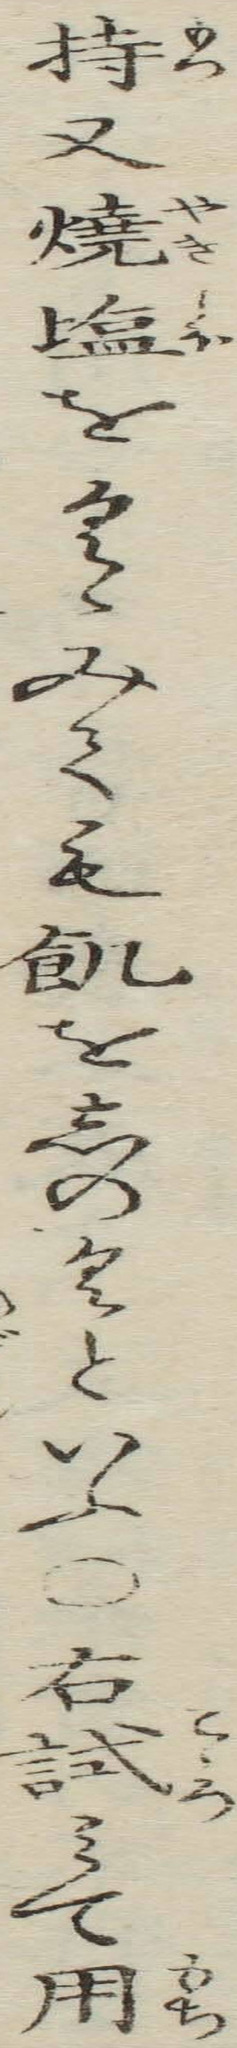持又焼塩をくゝみても飢をしのくといふ○右試みて用
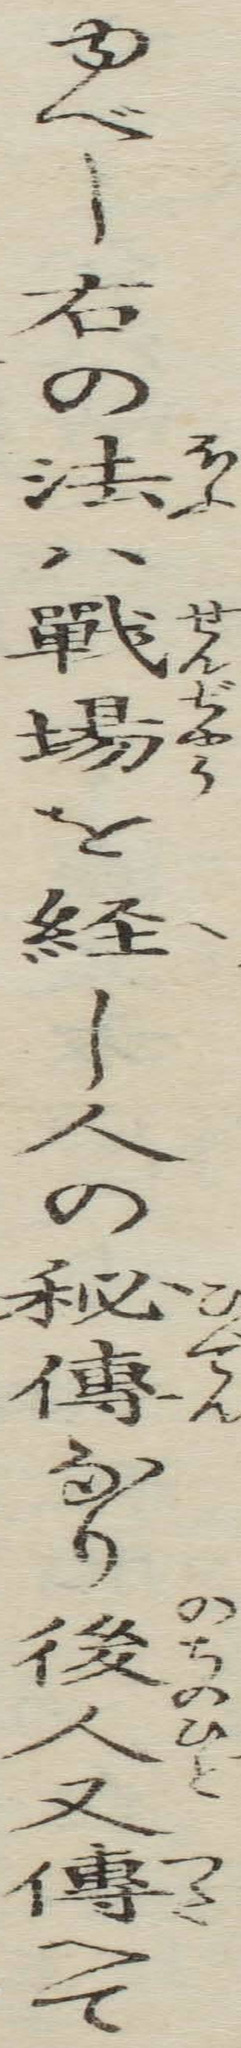ゆべし右の法は戦場を経し人の秘伝なり後人又伝へて
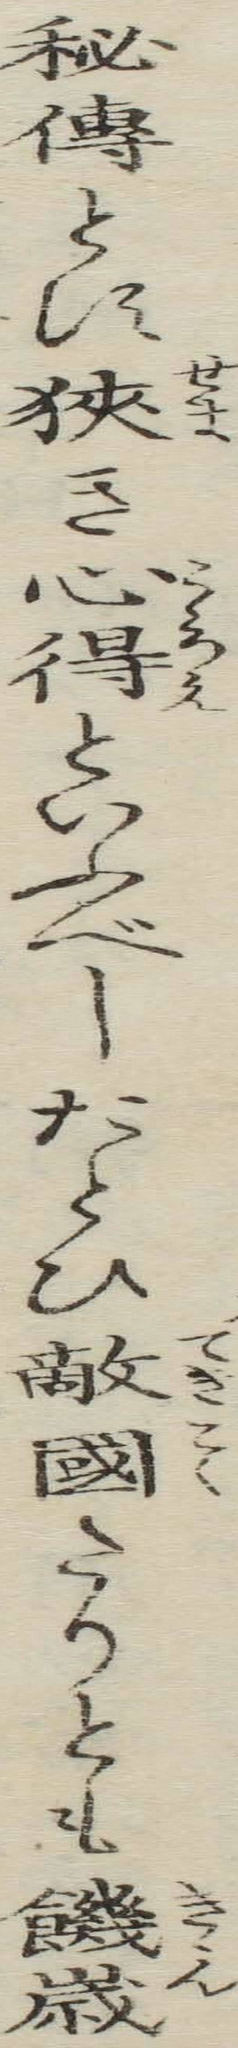秘伝とす狭き心得といふべしたとひ敵国たりとも饑歳
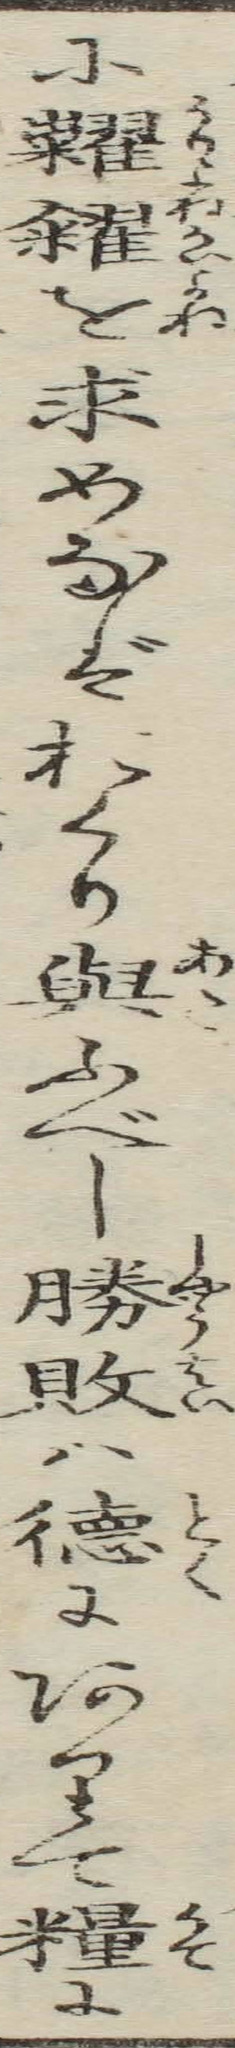に糶糴を求めなばおくり與ふべし勝敗は徳にありて糧に
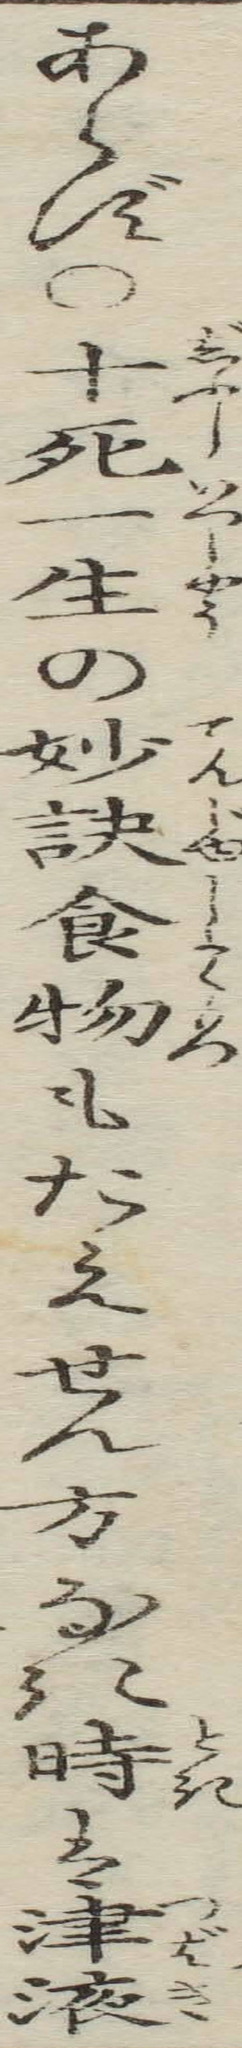あらず○十死一生の妙訣食物もたえせん方なき時は津液
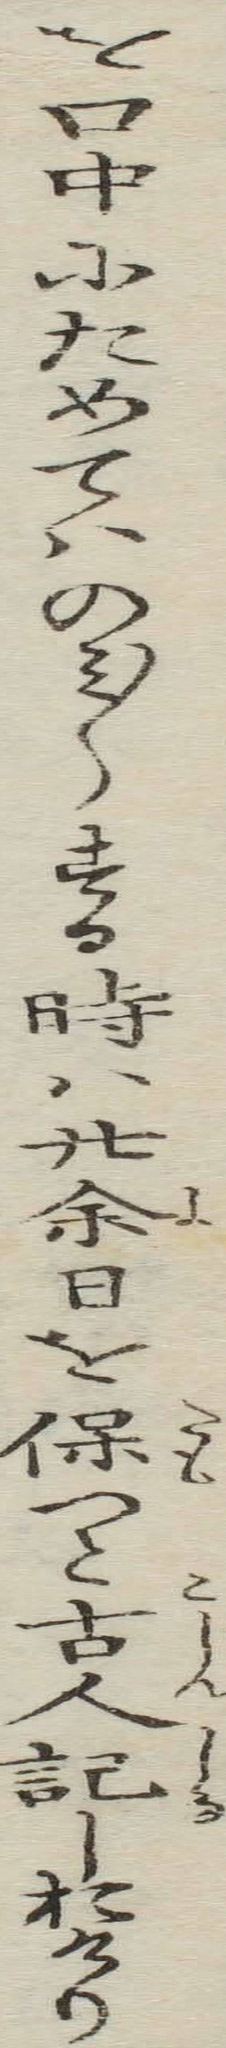を口中にためてはのみ〳〵する時は廿余日を保つと古人記しおけり
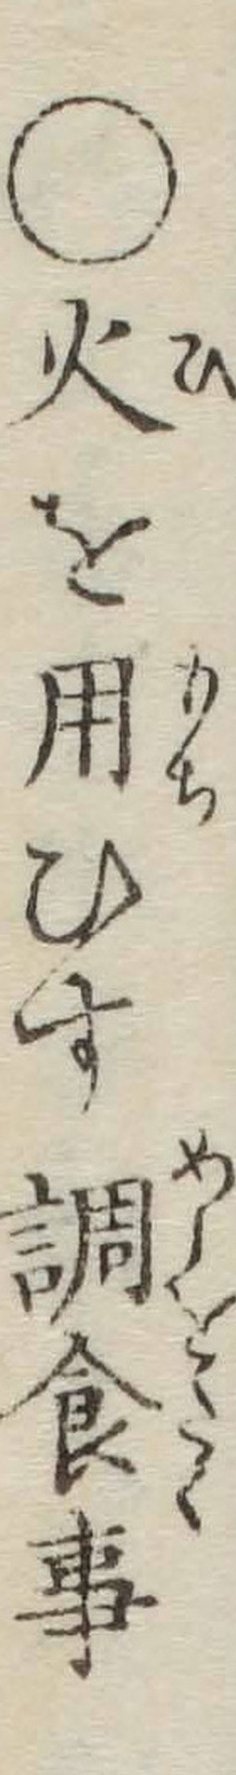○火を用ひす調食事
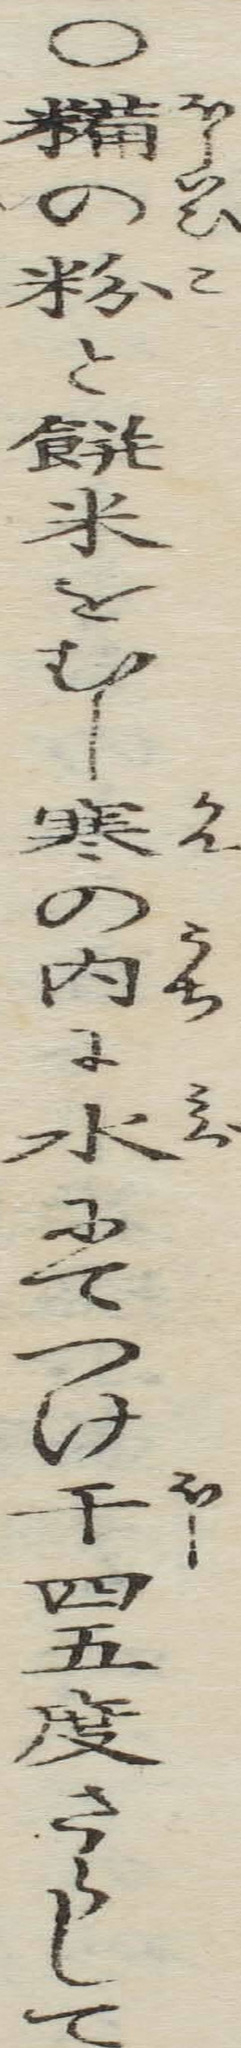○糒の粉と餅米をむし寒の内に水にてつけ干四五度さらして
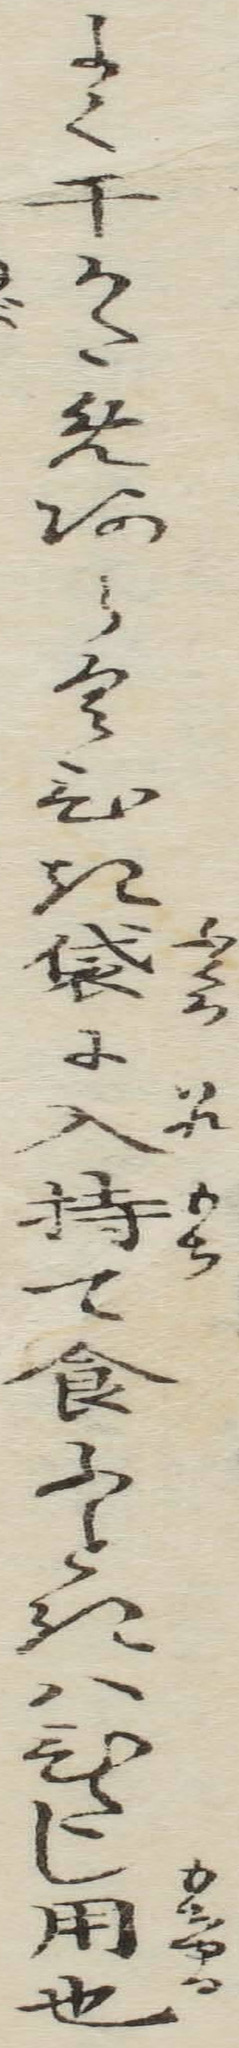よく干かためあらくひき袋に入持て食ふときはひたし用也
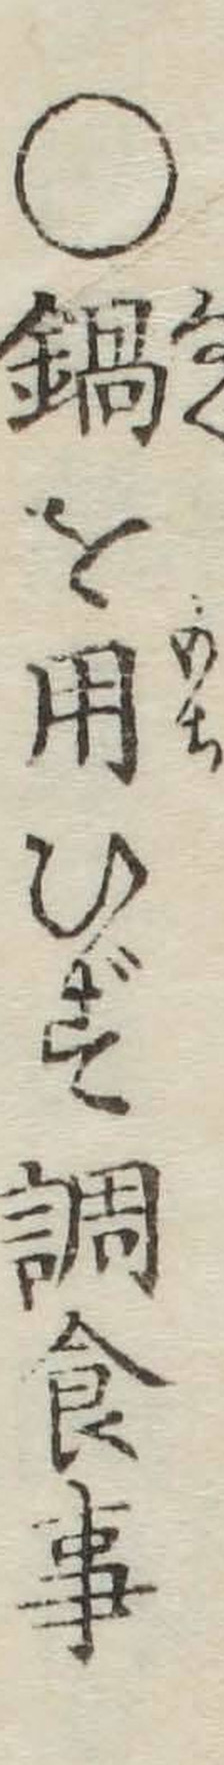○鍋を用ひず調食事
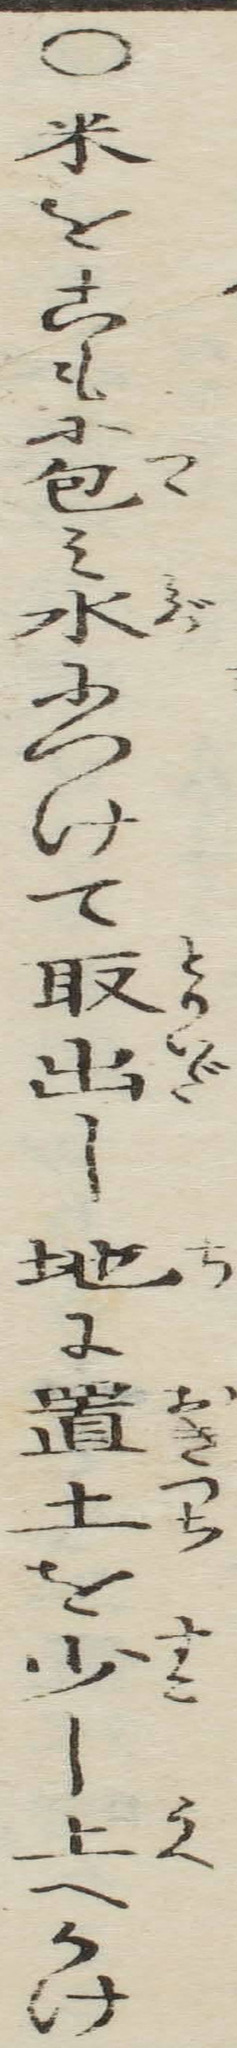○米をこもに包み水につけて取出し地に置土を少し上へかけ
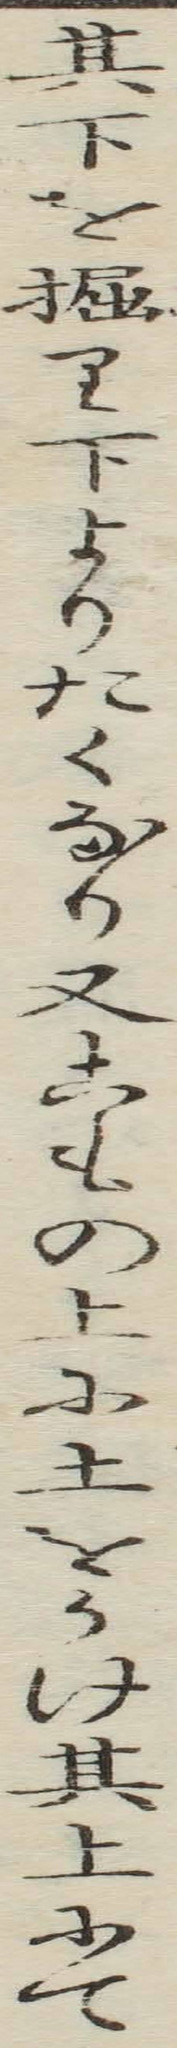其下を掘り下よりたくなり又こもの上に土をかけ其上にて
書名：救荒便覧
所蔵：国文学研究資料館
